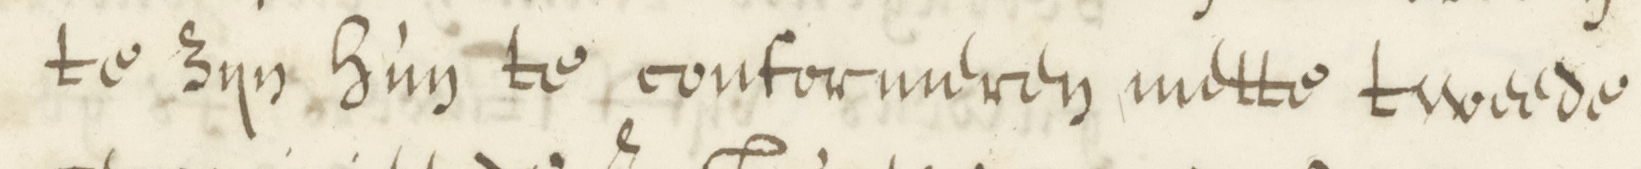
te zyn hun te conformeren mette tweede
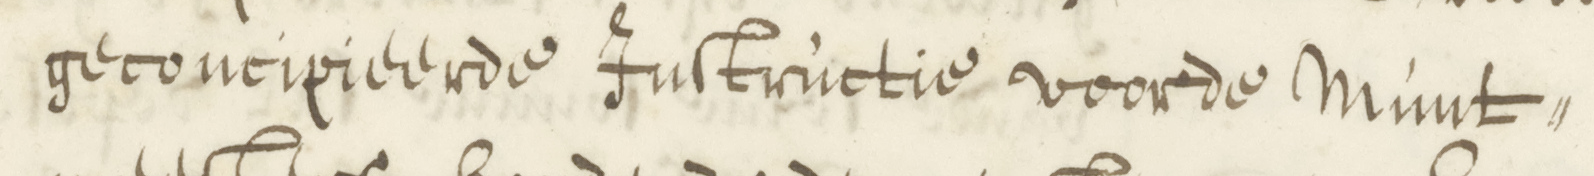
geconcipieerde Instructie voorde Munt„
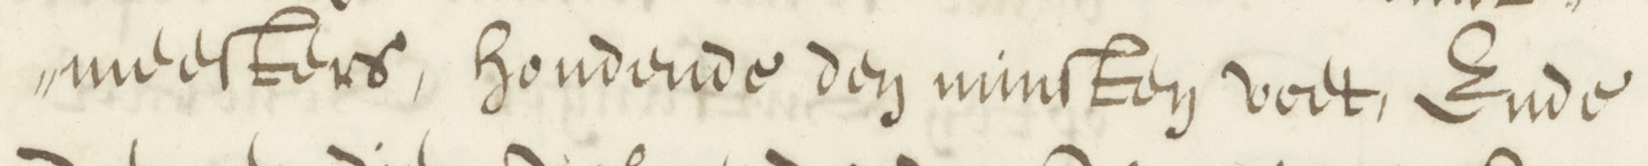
„meesters, houdende den minsten voet, Ende
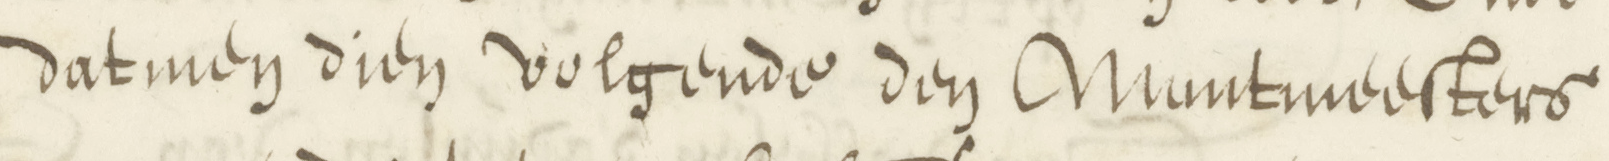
dat men dien volgende den Muntmeesters
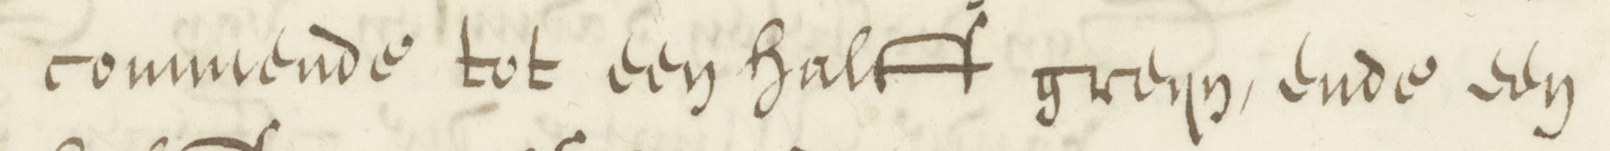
commende tot een halff greyn, ende een
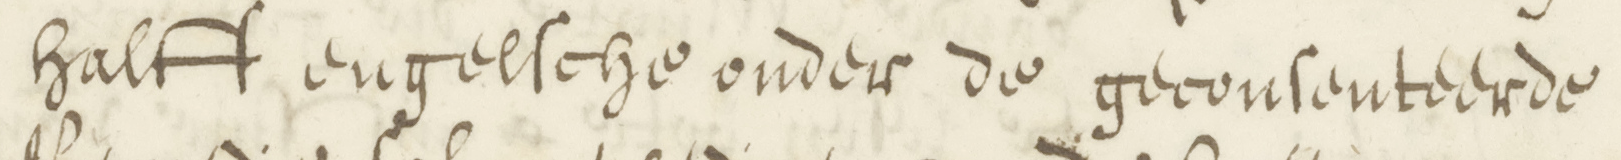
halff engelsche onder de geconsenteerde
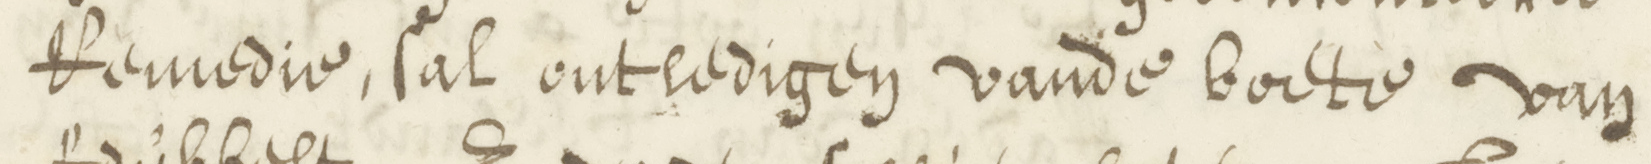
Remedie, sal ontledigen vande boete van
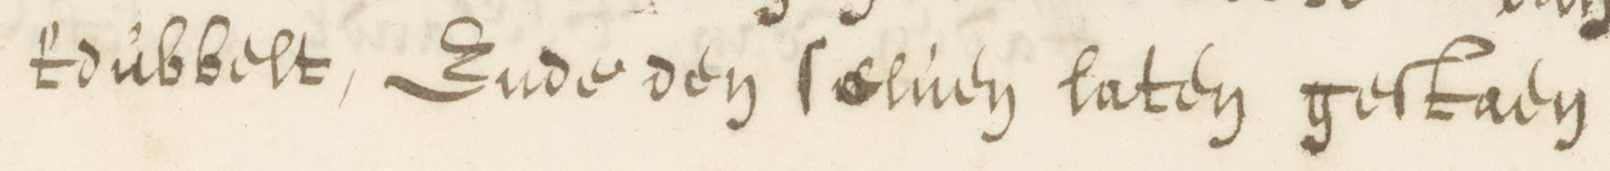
t'dubbelt, Ende den seluen laten gestaen
